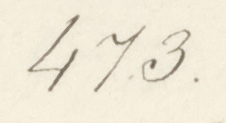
473.
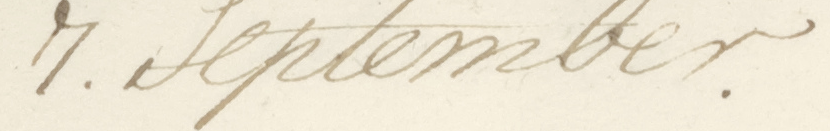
7. September
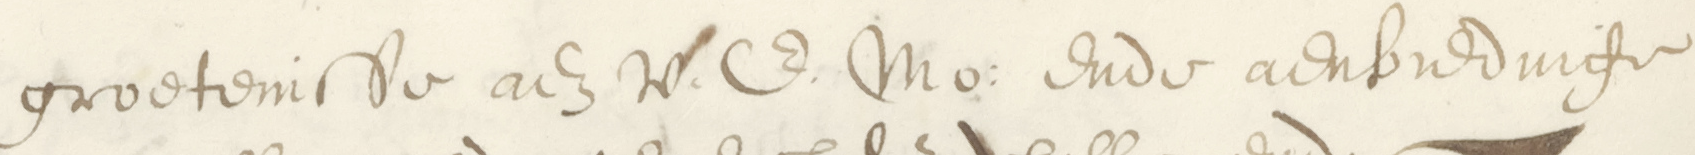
groetenisse aen u. E. Mo: ende aenbiedinge
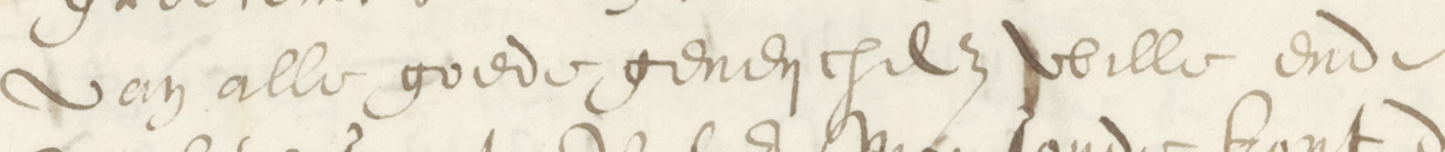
van alle goede geneychden wille ende
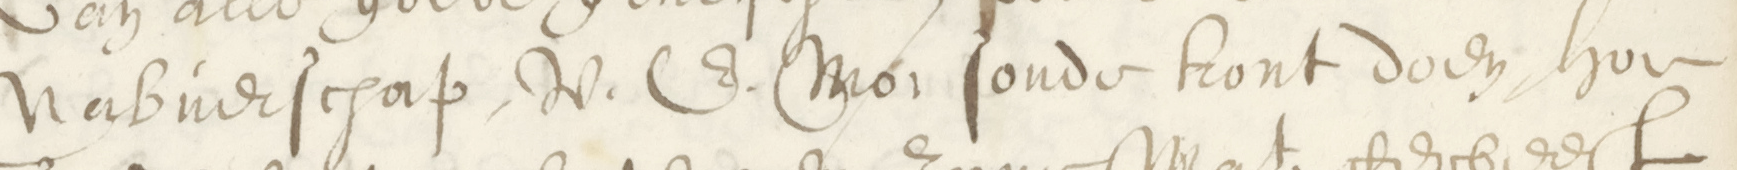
Nabuerschap, u. E. Mo: soude kont doen, hoe
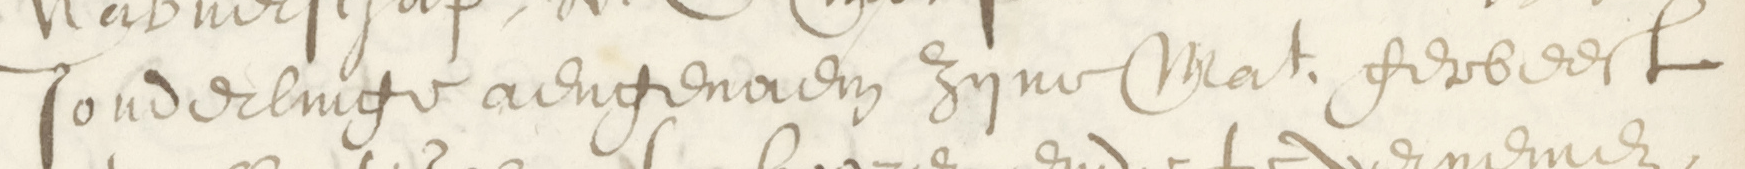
sonderlinge aengenaem zyne Mat. geweest
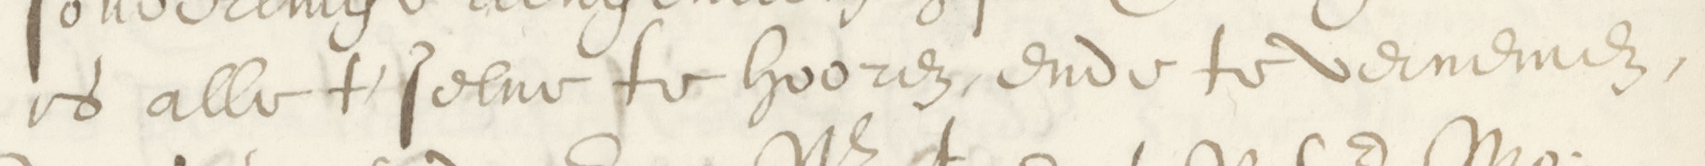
is alle t'selue te hooren, ende te vernemen,
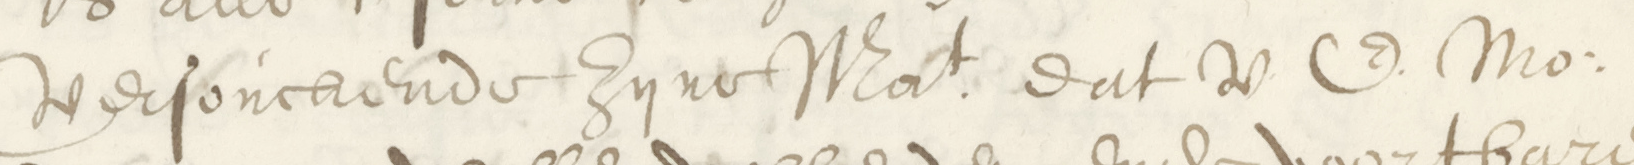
versouckende zyne Mat. dat u. E. Mo:
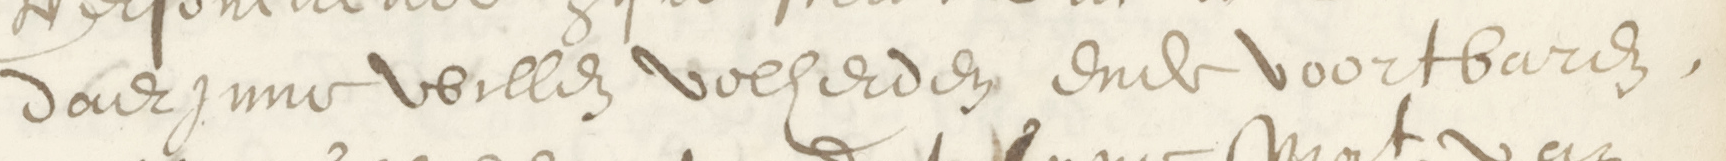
daerinne willen volherden ende voortbaren,
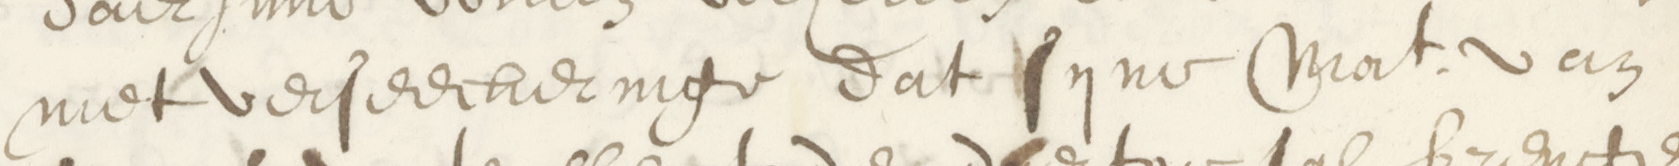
met verseeckeringe dat syne Mat. van
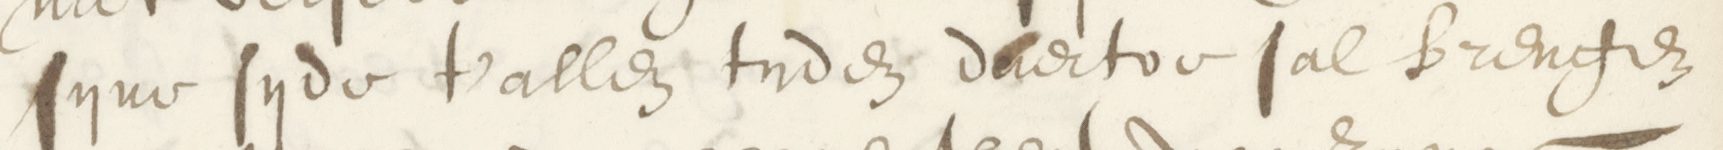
syne syde t'allen tyden daertoe sal brengen
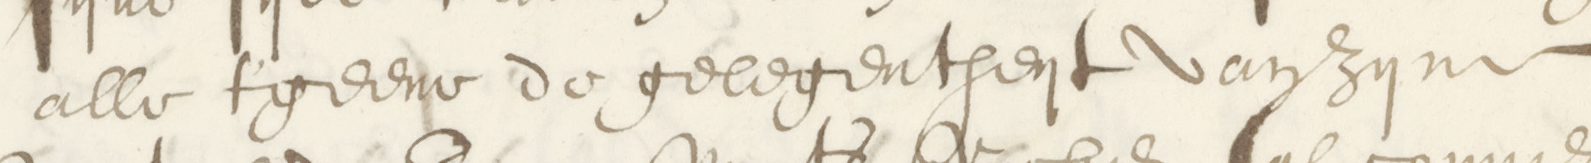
alle t'geene de gelegentheyt van zyne
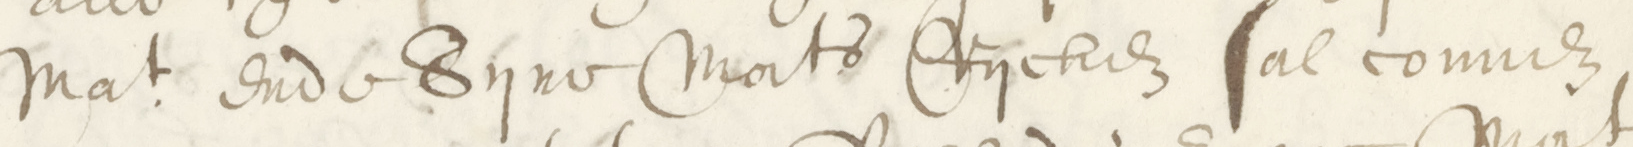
Mat. ende Syne mats Rycken sal connen
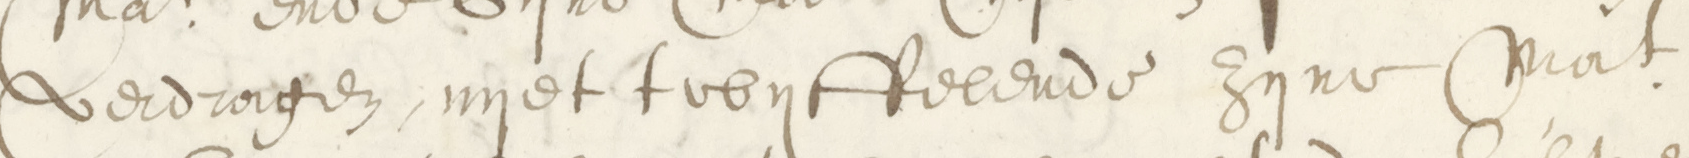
verdragen, nyet twyffelende zyne Mat.
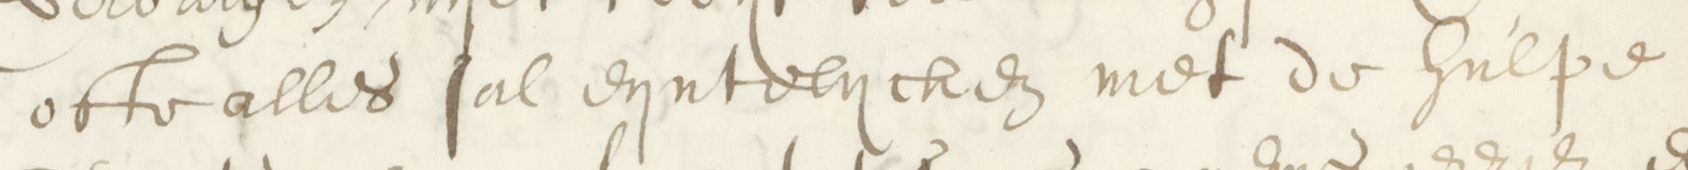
ofte alles sal eyntelycken met de hulpe
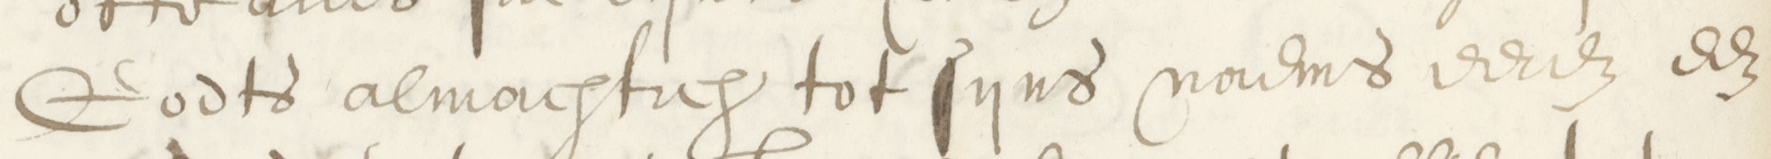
Godts almachtich tot syns naems eeren een
